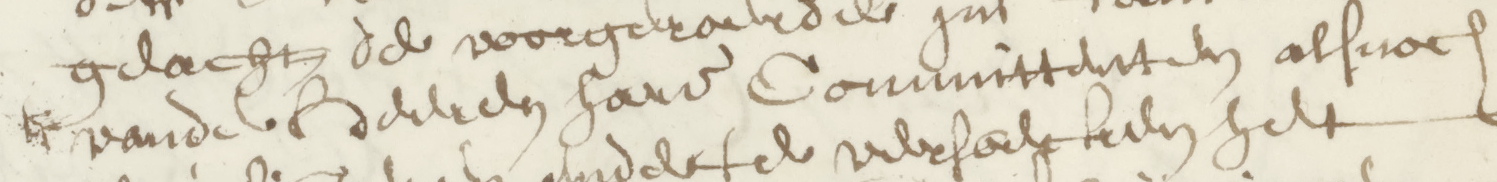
t vande Heeren hare Committenten alsnoch
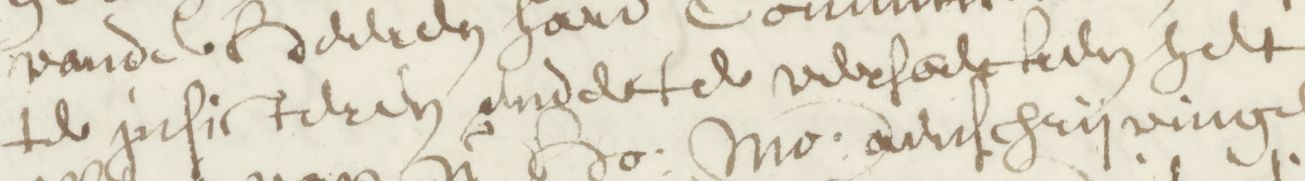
te insisteren, ende te versoecken het
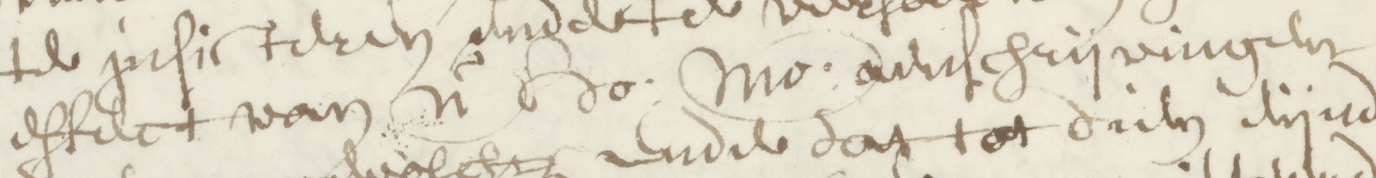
effect van U. Ho:Mo: aenschrijvingen
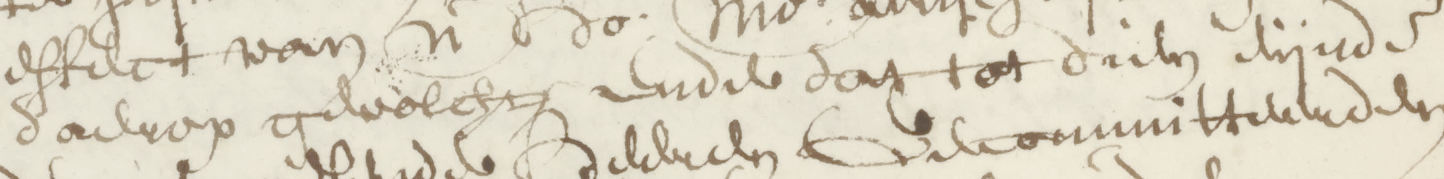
daerop gevolcht ende dat tot dien eijnde
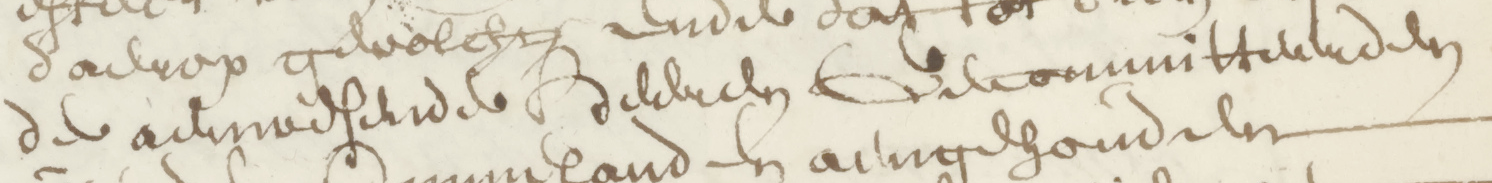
de aenwesende Heeren Gecommitteerden
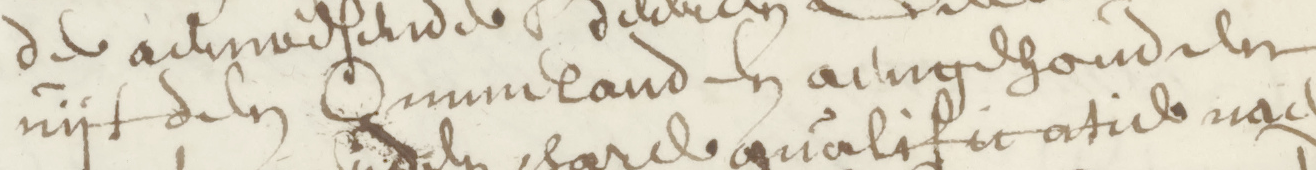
uijt den Ommelanden aengehouden
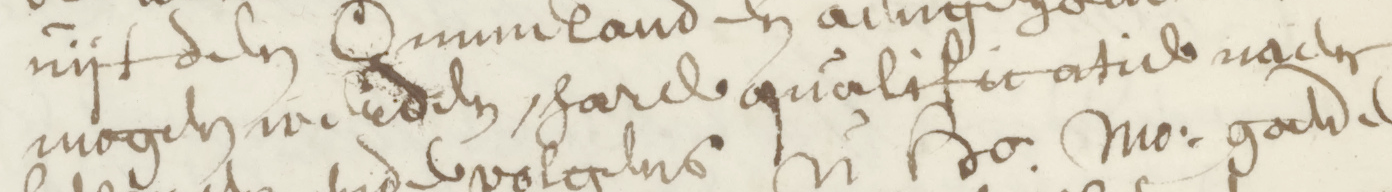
mogen werden, hare qualiticatie naer
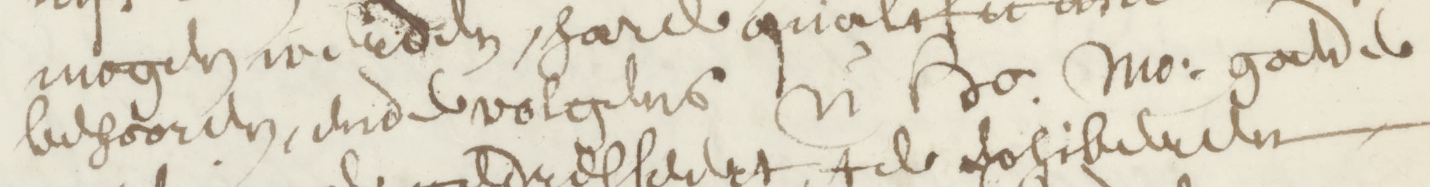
behooren, ende volgens U Ho:Mo: goede
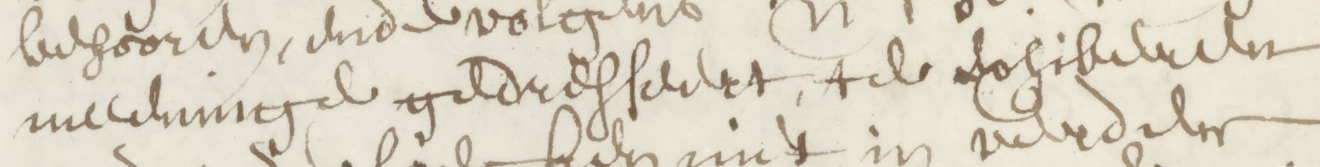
meeninge gedresseert, te exhiberen
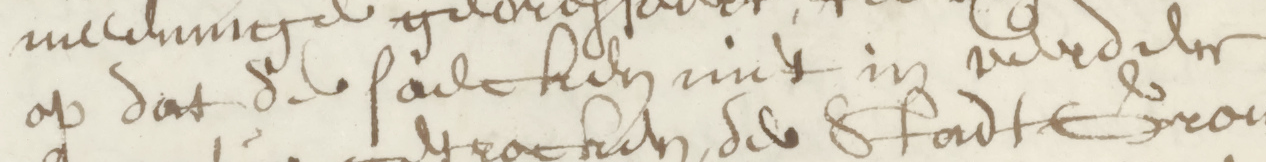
op dat de saecken met in verder
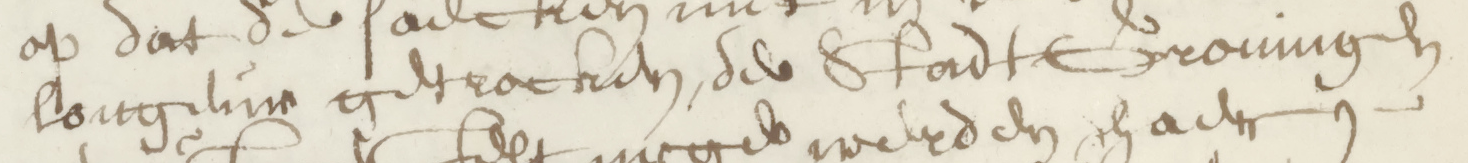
longeur getrocken, de Stadt Groningen
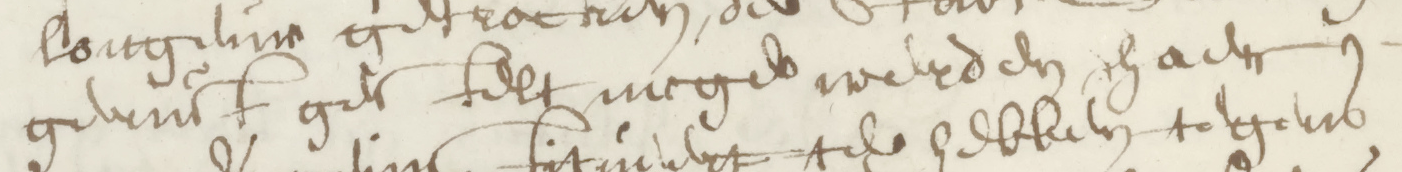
gerust gestelt moge werden, haer
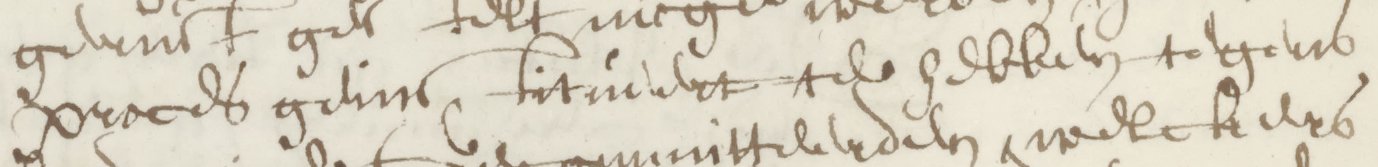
Proces geinstitueert te hebben tegens
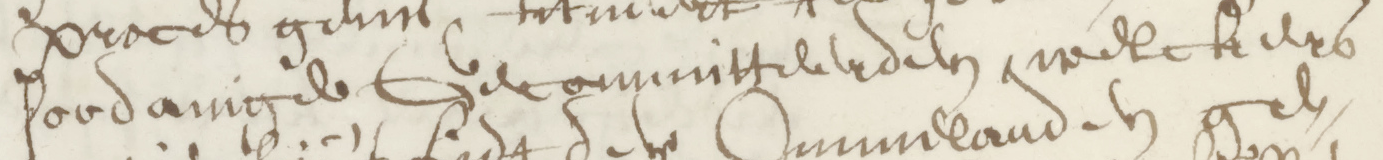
soodanige Gecommitteerden welckers
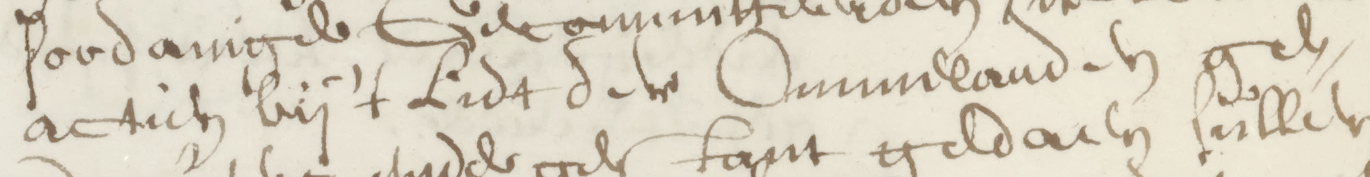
actien bij 't Lidt der Ommelanden ge„,
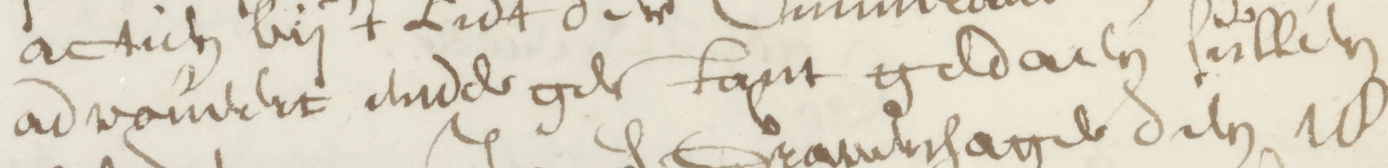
advoueert ende gestant gedaen sullen
